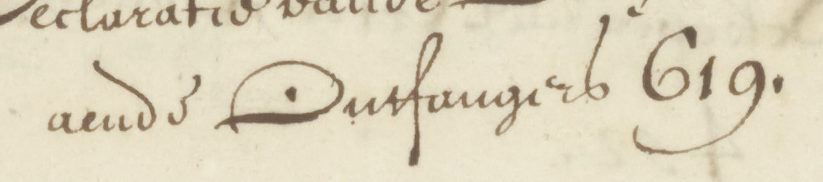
aende Ontfangers 619.
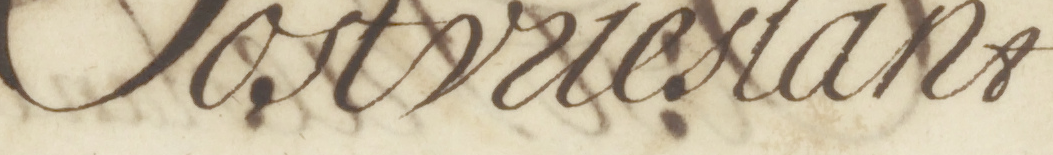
Oostvrieslant
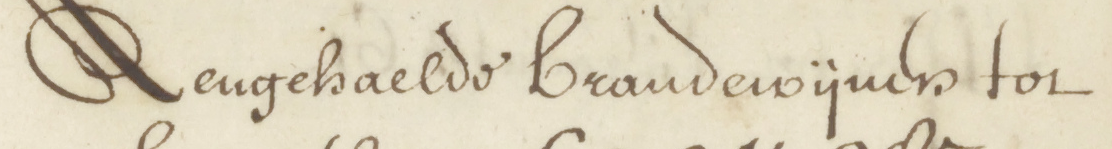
Aengehaelde brandewijnen tot
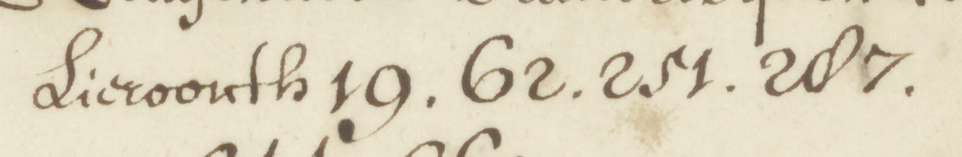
Lieroorth 19, 62, 251, 287,
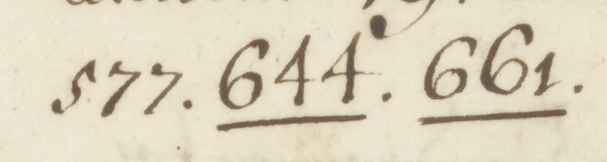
577, 644, 661.
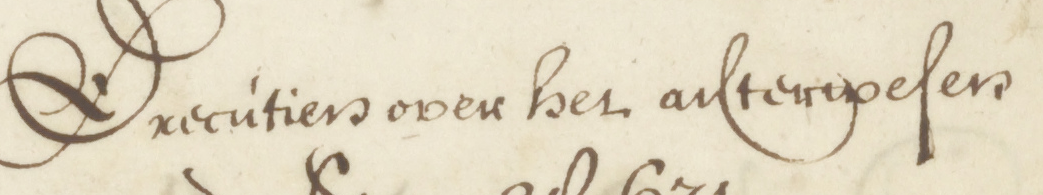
Executien over het achterwesen
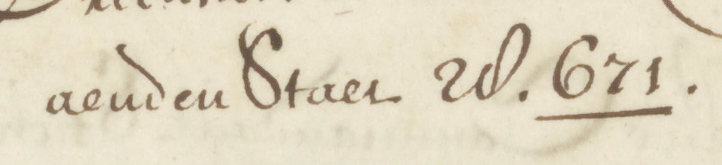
aenden Staet 28, 671.
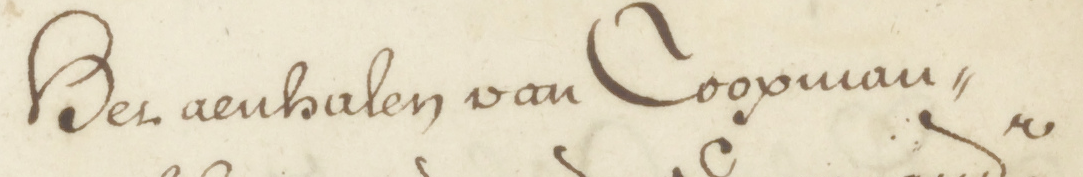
Het aenhalen van Coopman,,
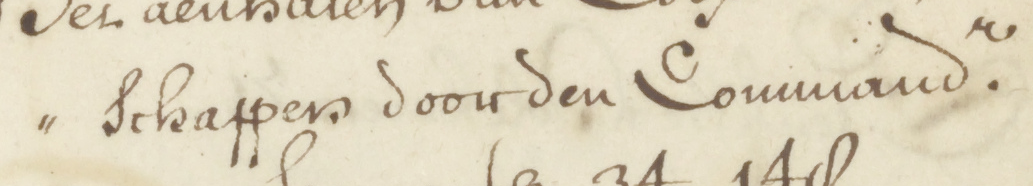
,, schappen door den Commandr.
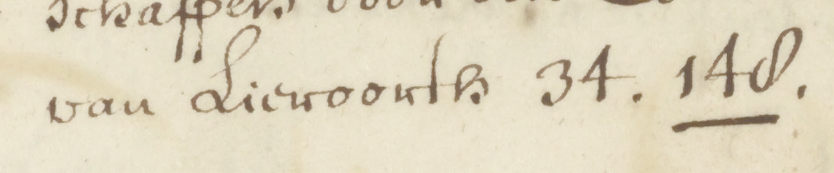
van Lieroorth 34, 148.
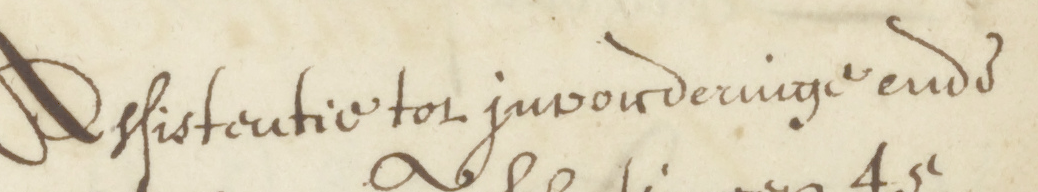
Assistentie tot invoirderinge ende
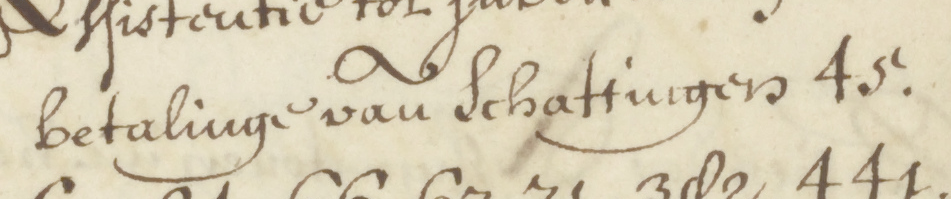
betalinge van Schattingen 45,
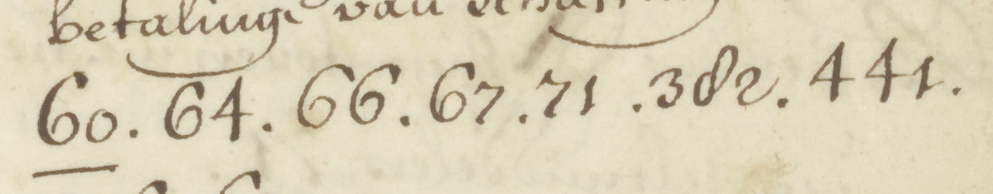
60, 64, 66, 67, 71, 382, 441
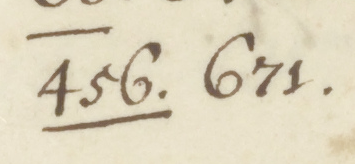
456, 671.
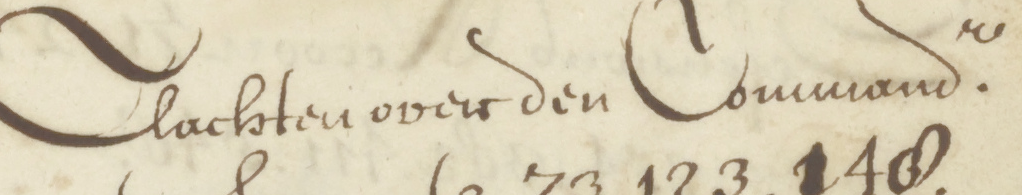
Clachten over den Commandr.
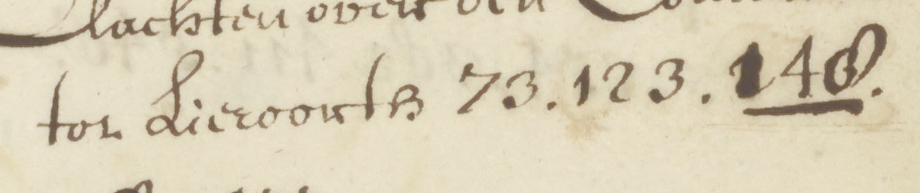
tot Lieroorth 73, 123, 148,
